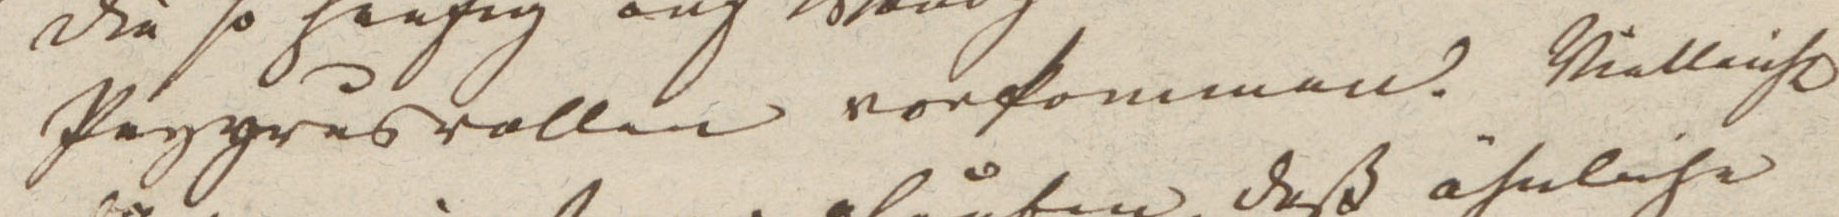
Papyrusrollen vorkommen. Vielleicht
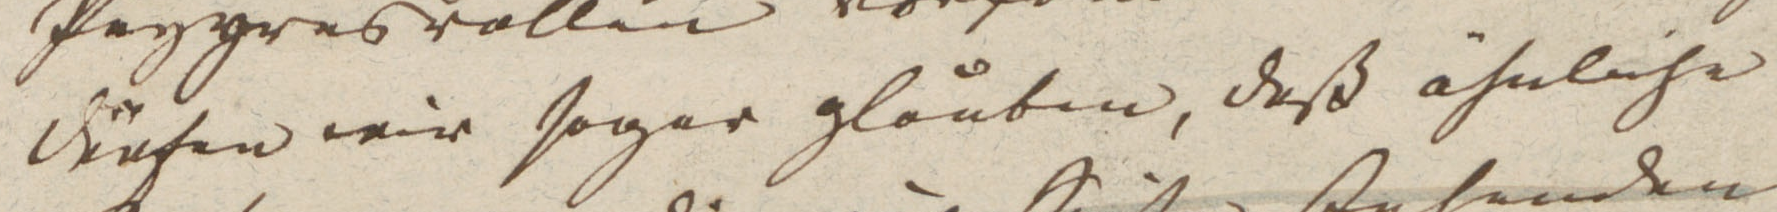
dürfen wir sogar glauben, dass ähnliche
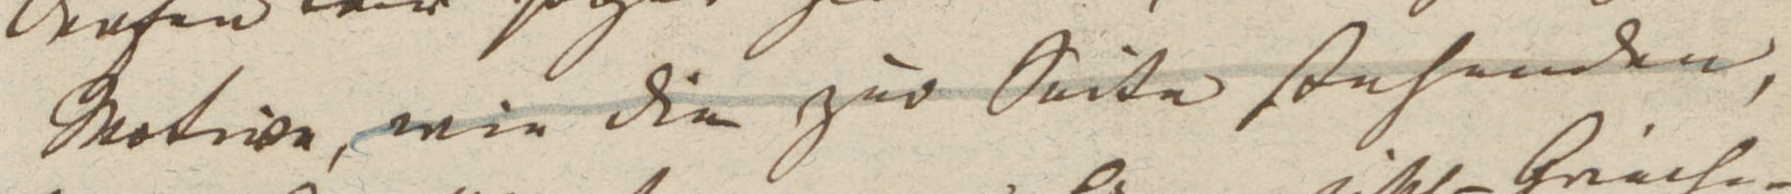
Motive, wie die zur Seite stehenden,
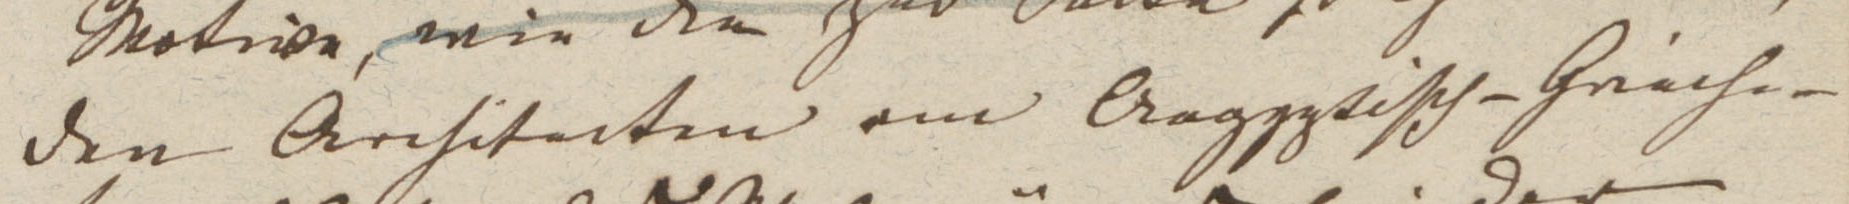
den Architecten am Aegyptisch-Griechi-
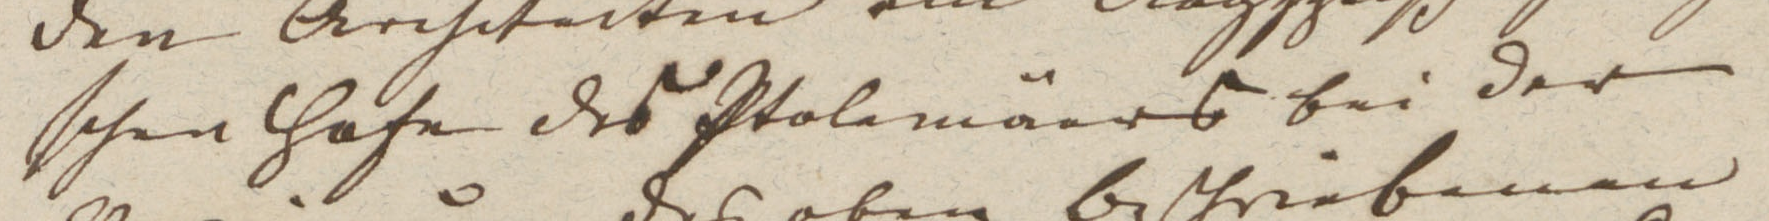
schen Hofe des Ptolemäers bei der
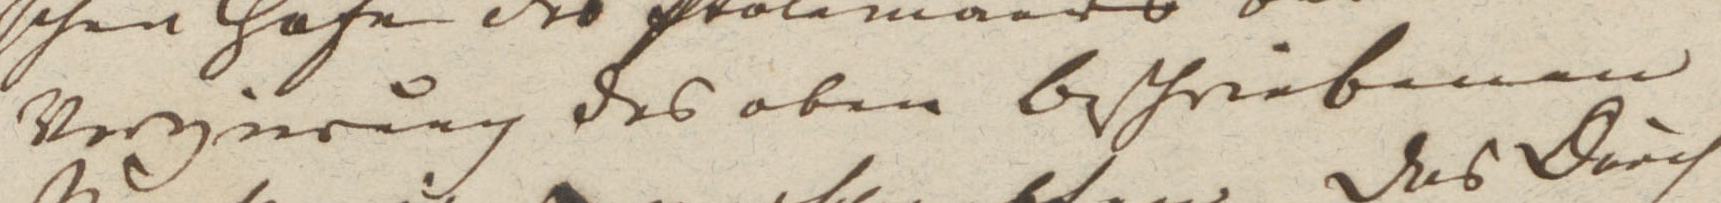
Verzierung des oben beschriebenen
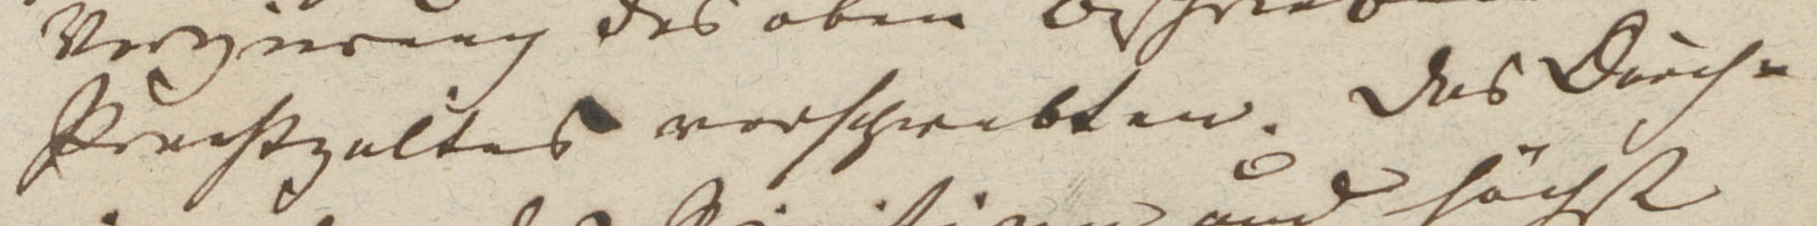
Prachtzeltes vorschwebten. Das dDurch-
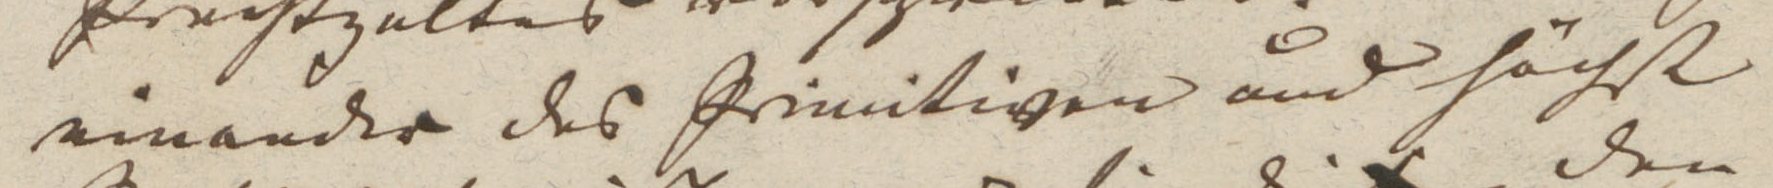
einander des Primitiven und höchst
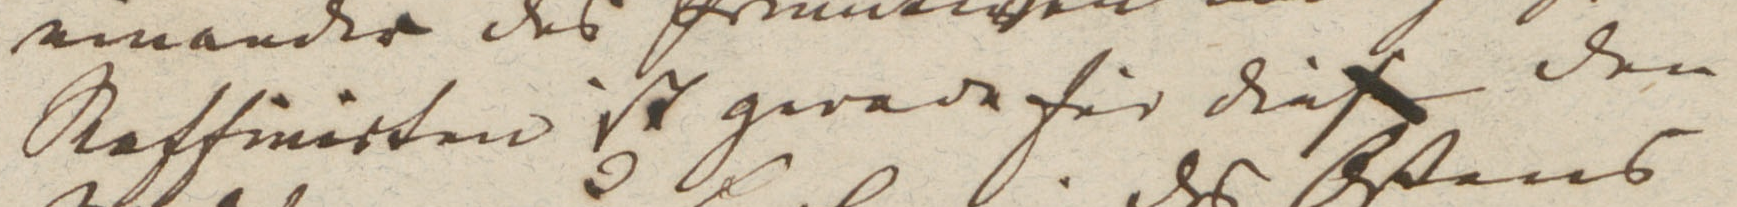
Raffinirten ist gerade für diese den
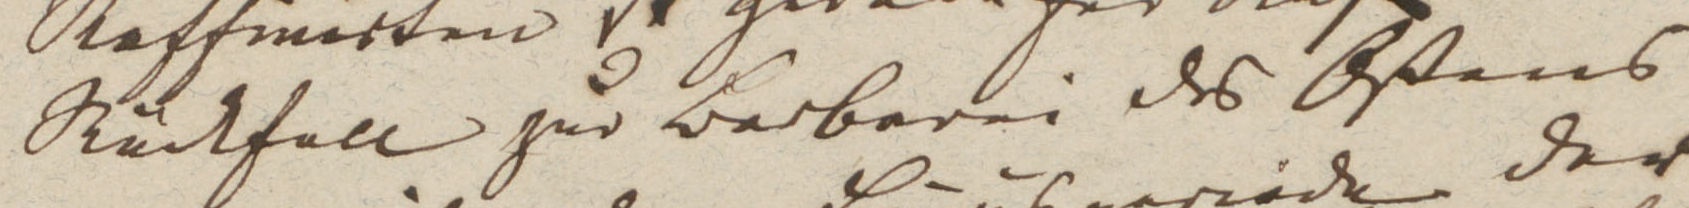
Rückfall zur Barbarei des Ostens
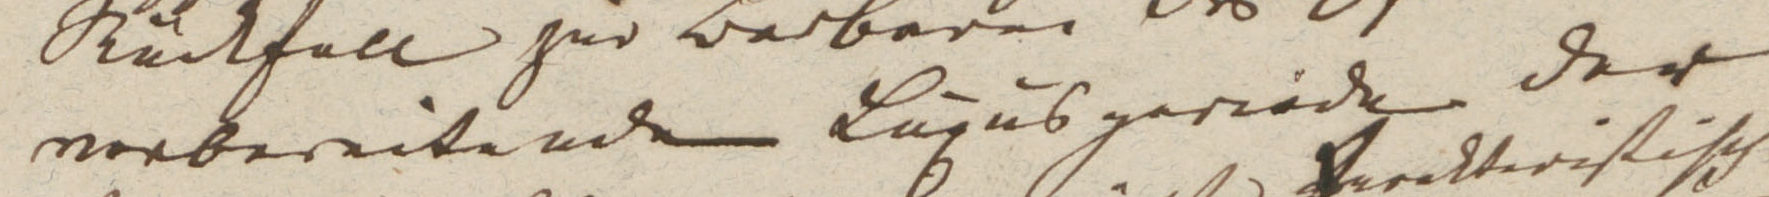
vorbereitende Luxusperiode der
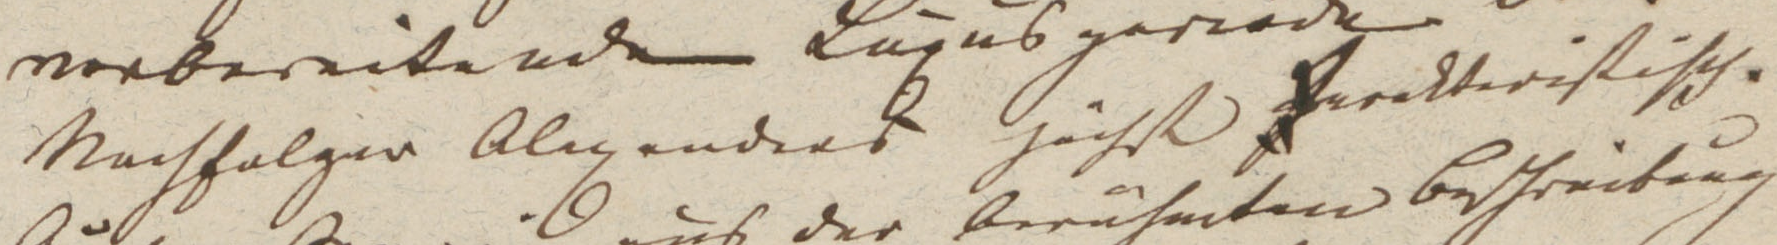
Nachfolger Alexanders höchst charakteristisch.
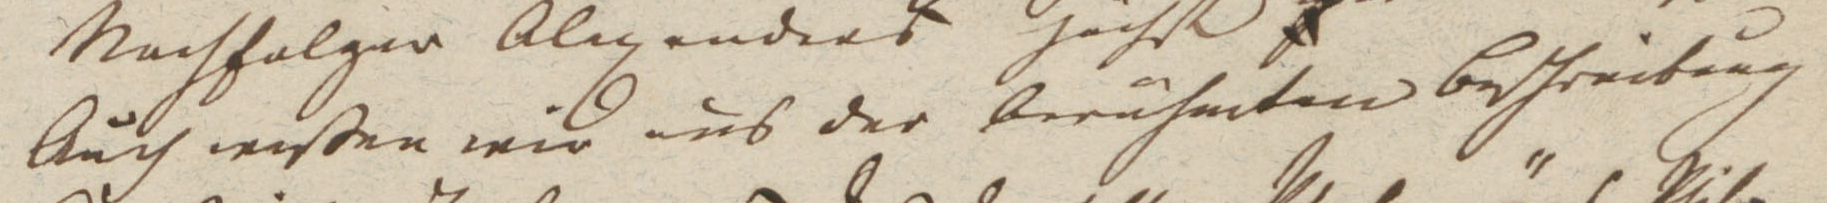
Auch wissen wir aus der berühmten Beschreibung
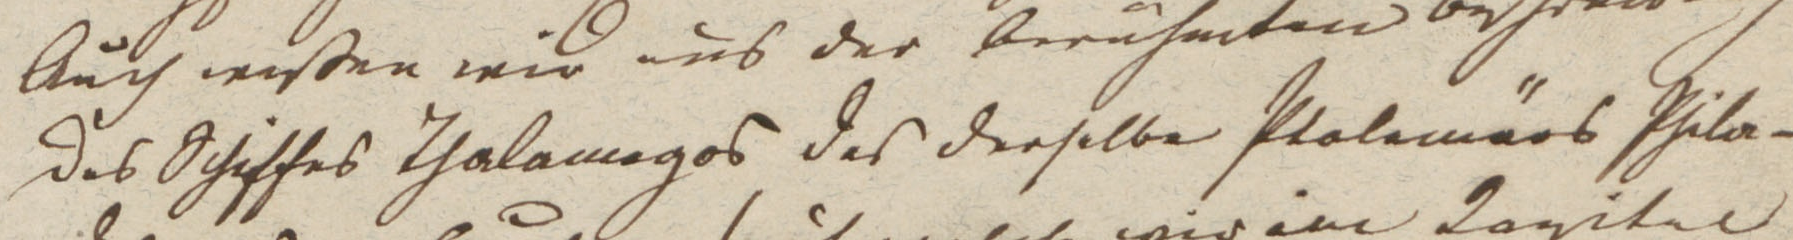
des Schiffes Thalamogos das derselbe Ptolemäus Phila-
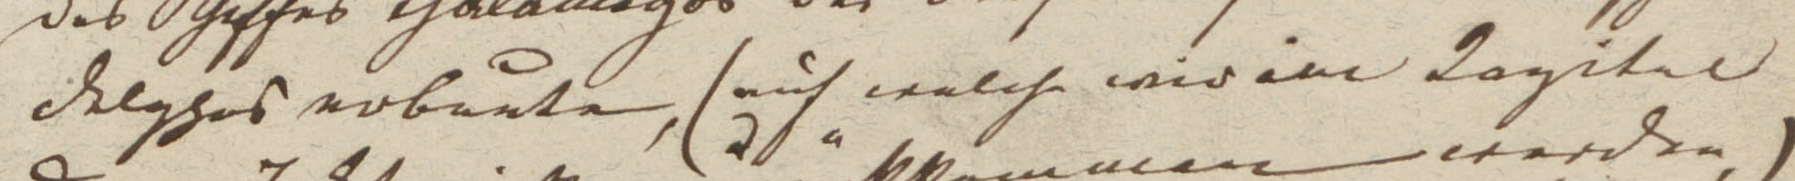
delphos erbaute, (auf welche wir im Kapitel
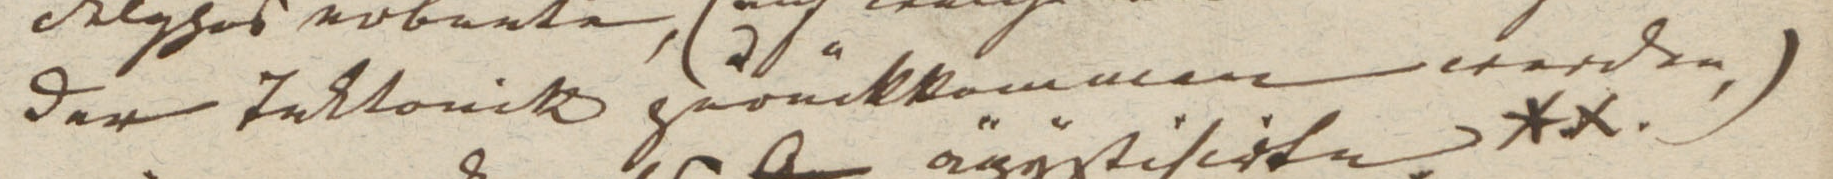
der Tektonik zurückkommen werden,)
